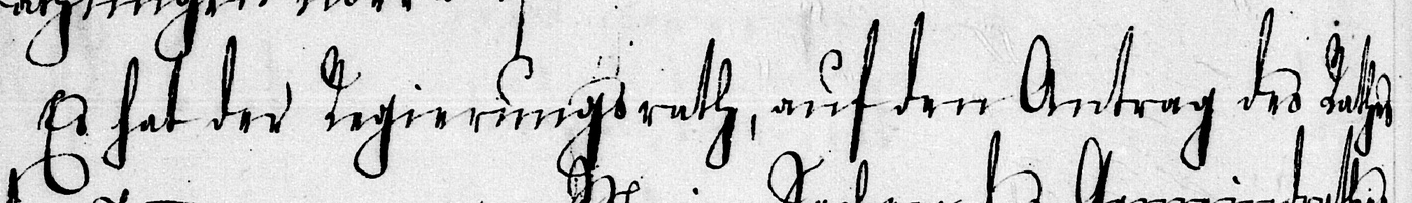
Es hat der Regierungsrath, auf den Antrag des Rath¬
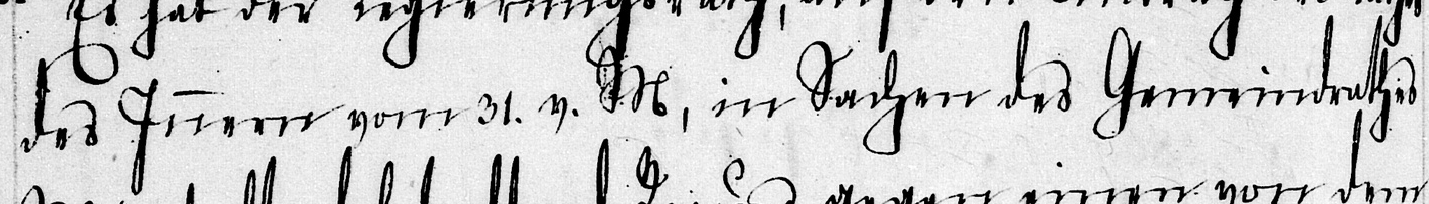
des Innern vom 31. v. M., in Sachen des Gemeindrathes
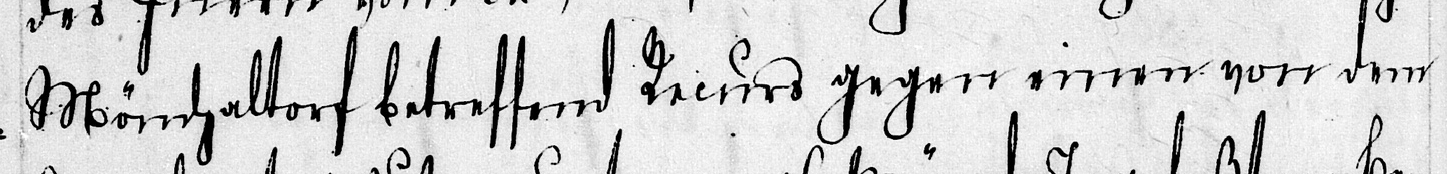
Mönchaltorf betreffend Recurs gegen einen von dem
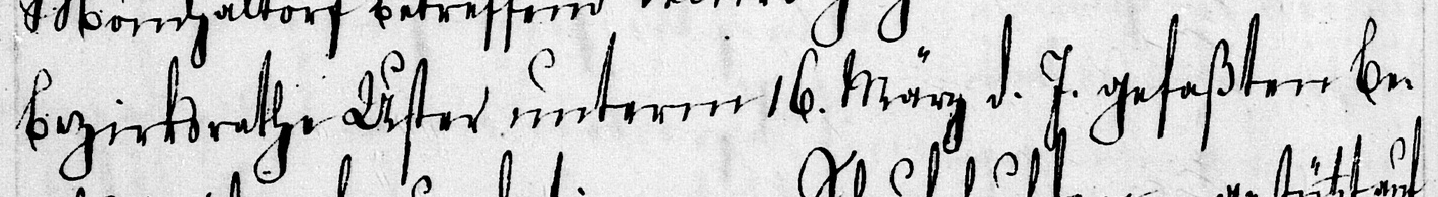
Bezirksrathe Uster unterm 16. März d. J. gefaßten Be¬
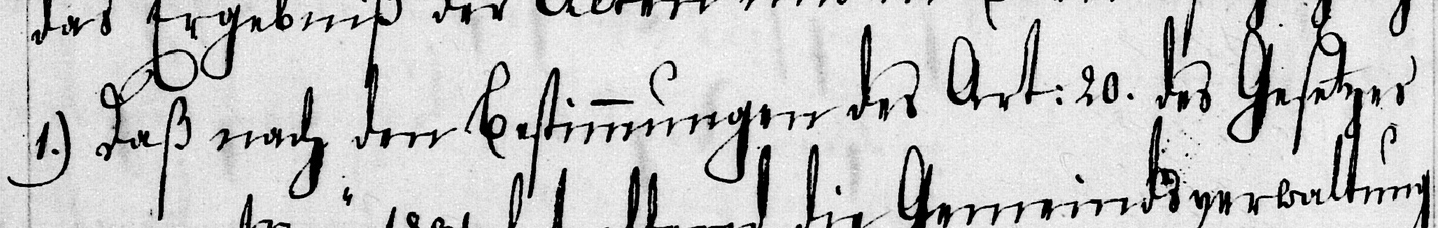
1.) Daß nach den Bestimmungen des Art: 20. des Gesetzes
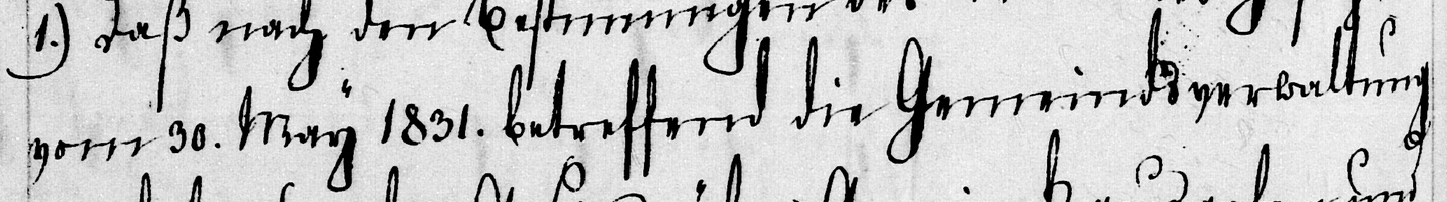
vom 30. May 1831. betreffend die Gemeindsverwaltung
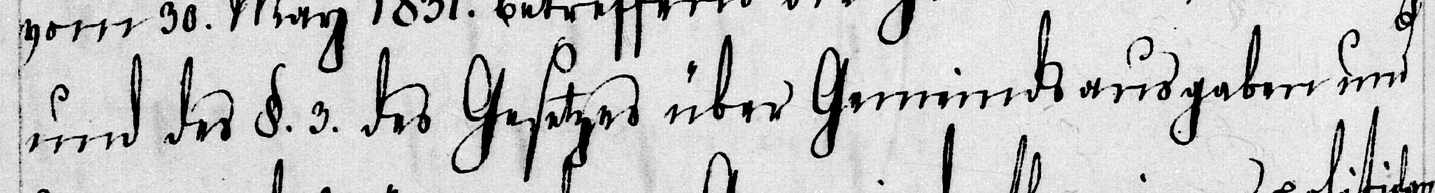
und des §. 3. des Gesetzes über Gemeindsausgaben und
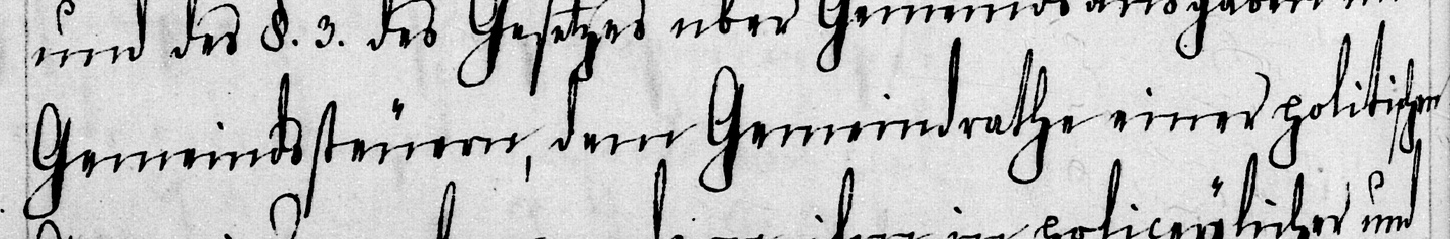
Gemeindssteuern, dem Gemeindrathe einer politisc¬
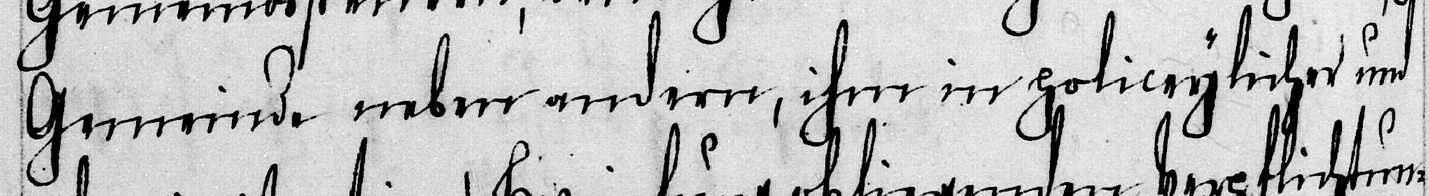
Gemeinde neben andern, ihm in policeylicher und
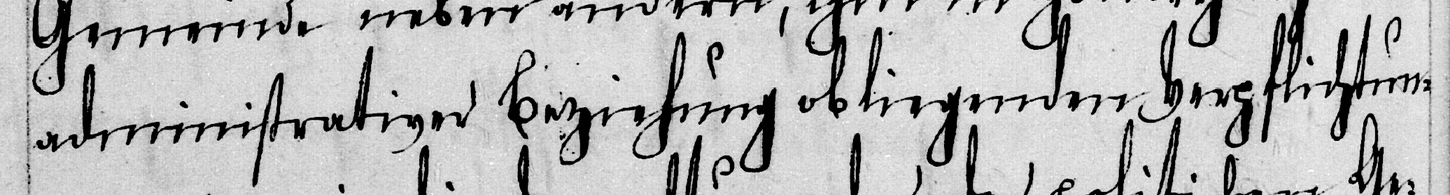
administrativer Beziehung obliegenden Verpflichtun¬
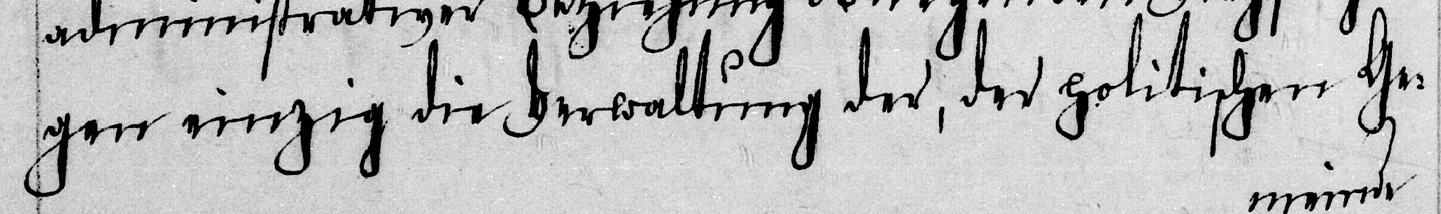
gen einzig die Verwaltung der, der politischen Ge-
